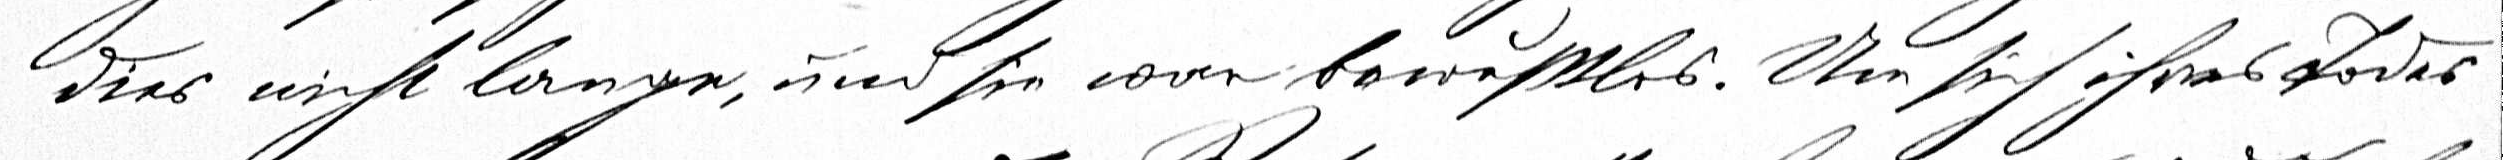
dies nicht lange, und sie war bewußtlos. Um sich ihres Todes
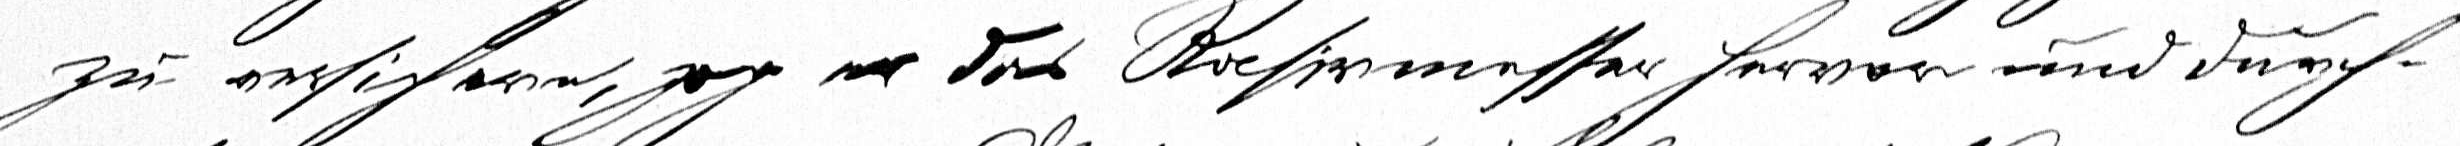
zu ersichern, zog er das Raisermesser hervor und durch¬
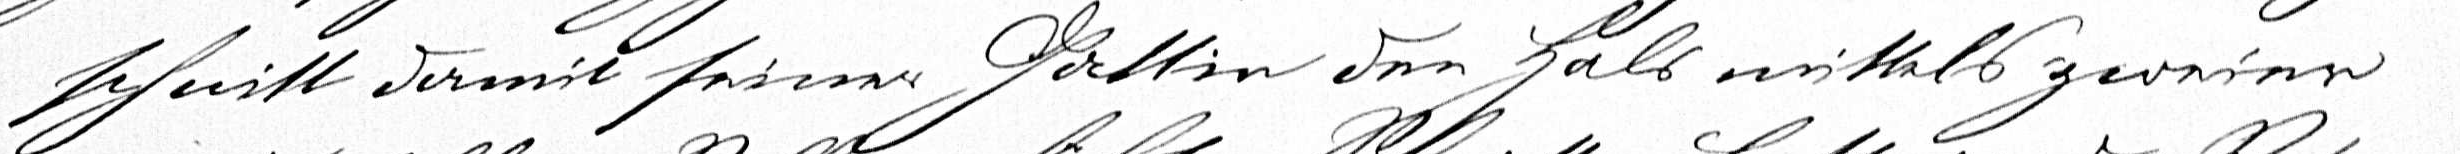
schnitt damit seiner Gattin den Hals mittels zweier
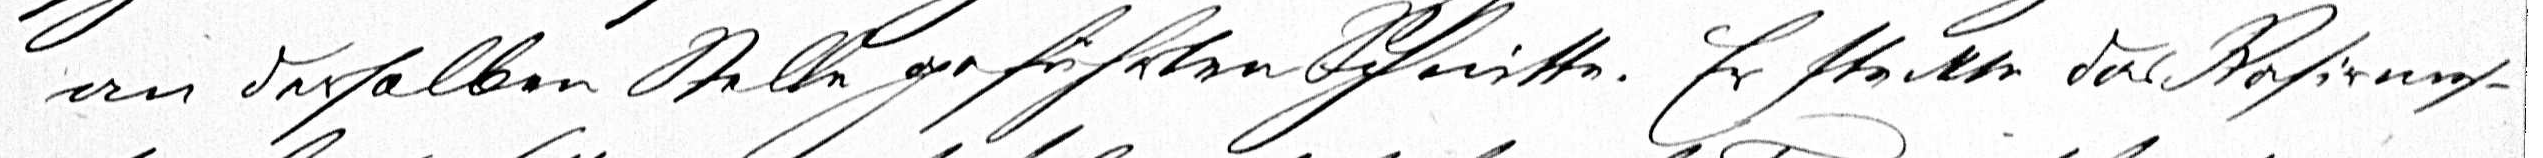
an derselben Stelle geführten Schnitte. Er steckte das Rasirmes¬
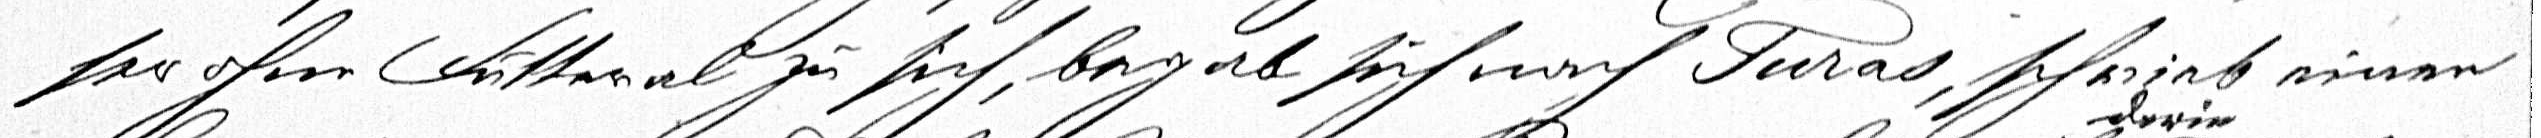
ser ohne Futteral [sheath] zu sich, begab sich nach Turas, schrieb einen
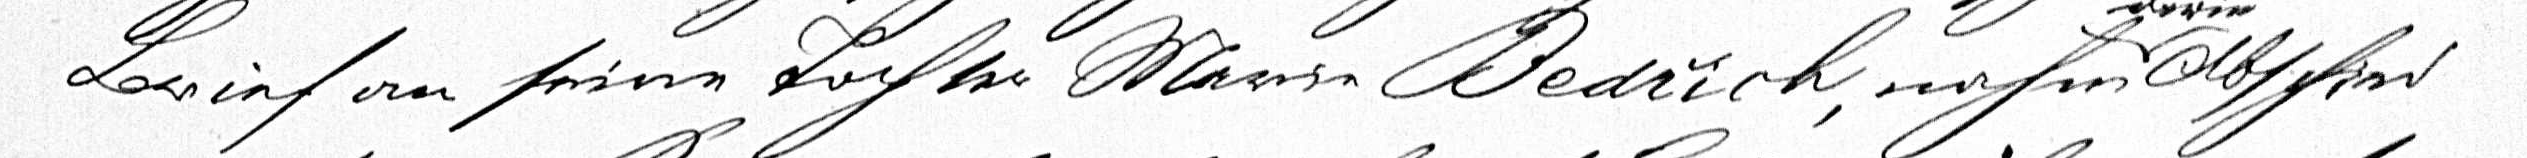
Brief an seine Tochter Marie Bedřioh, nahm darin Abschied
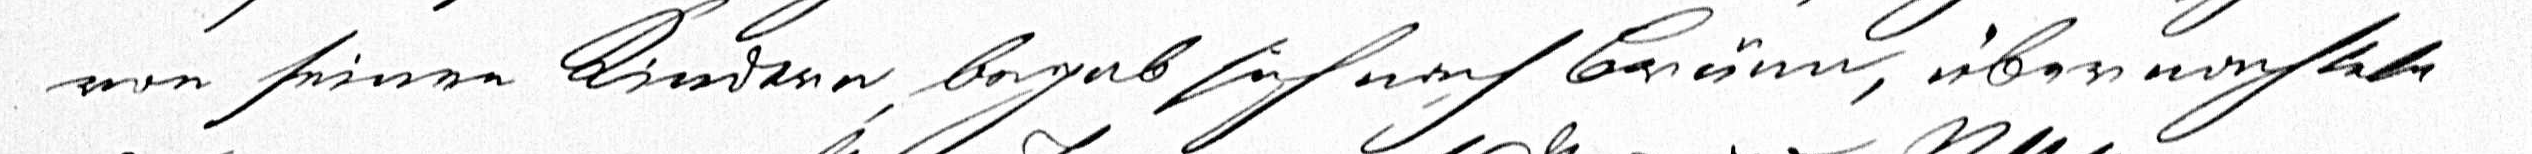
von seinen Kindern, begab sich noch Brünn, übernachtete
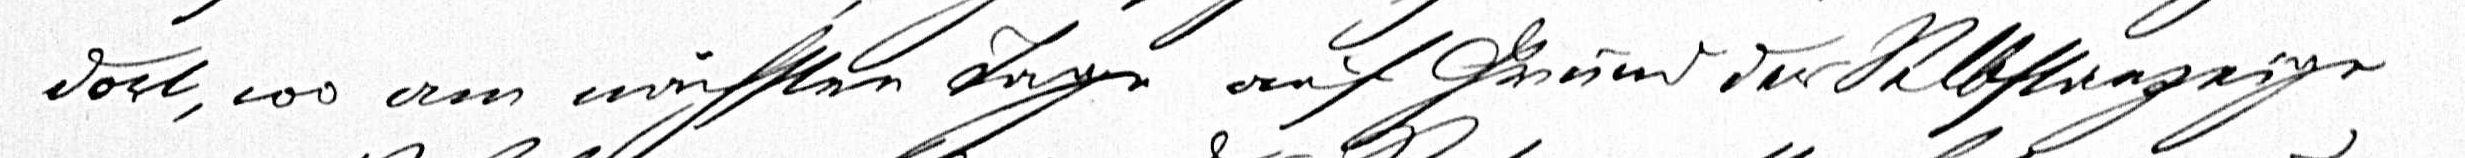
dort, wo am nächsten Tage auf Grund der Seltanzeige
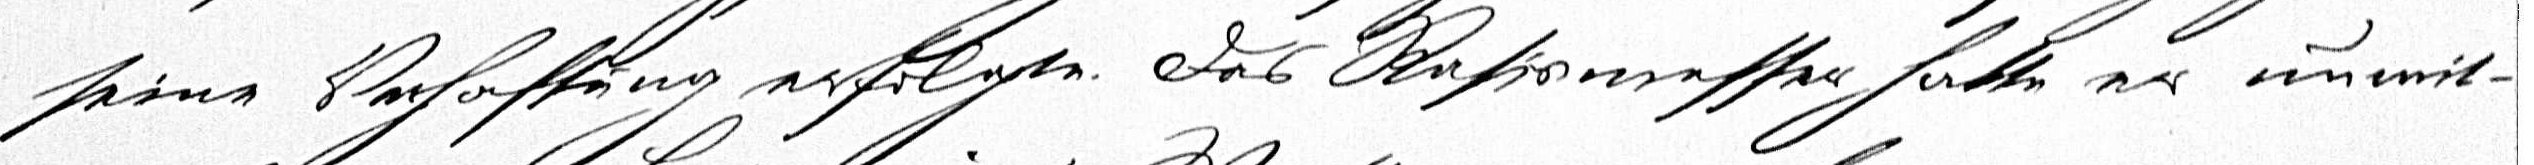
seine Verhaftung erfolgte. Das Rasirmesser hatte er unmit¬
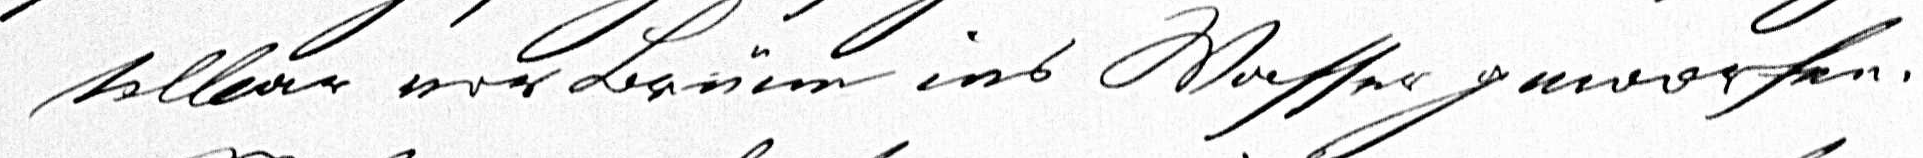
telbar vor Brünn ins Wasser geworfen.
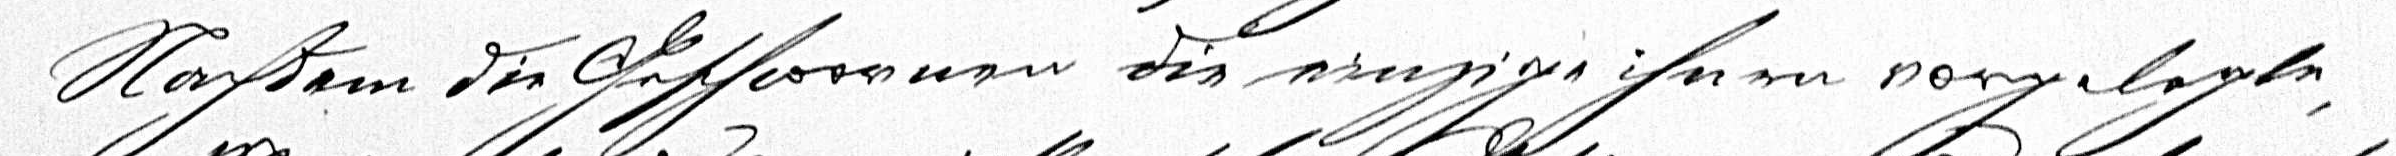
Nachdem die Geschworene die einzige ihnen vorgelegte
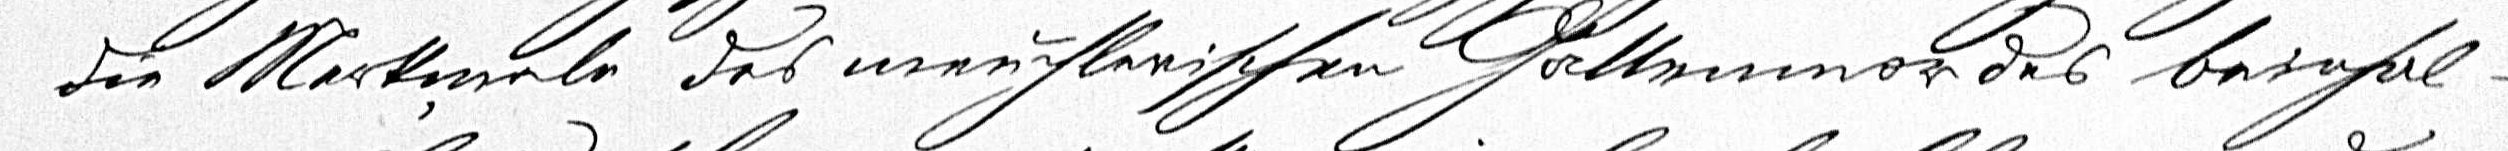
die Merkmale des meuchlerischen Gattenmordes beinhal¬
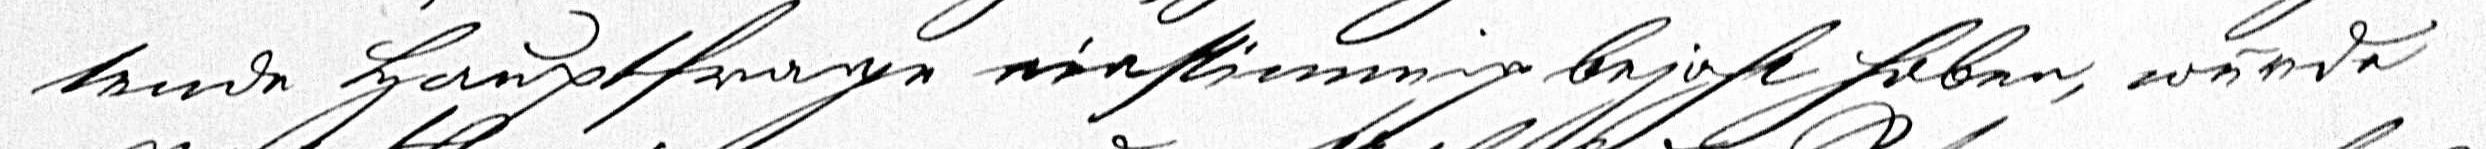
tende Hauptfrage einstimmig bejaht haben, wurde
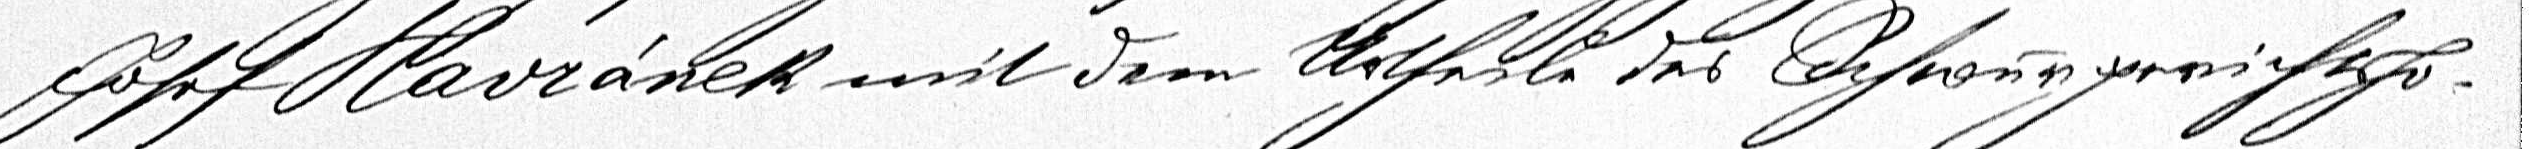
Josef Havránek mit dem Urtheile des Schwurgerichtsho¬
